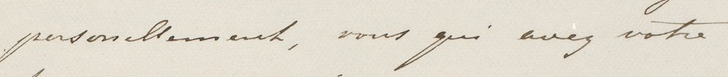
personellement, vous qui avez votre
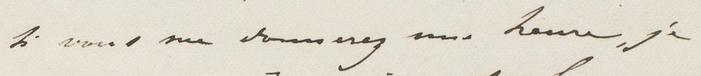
Si vous me donnerez une heure, je
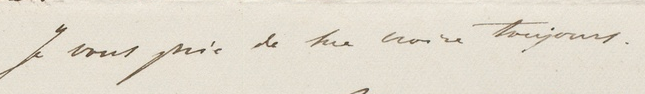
Je vous prie de me croire toujours.
